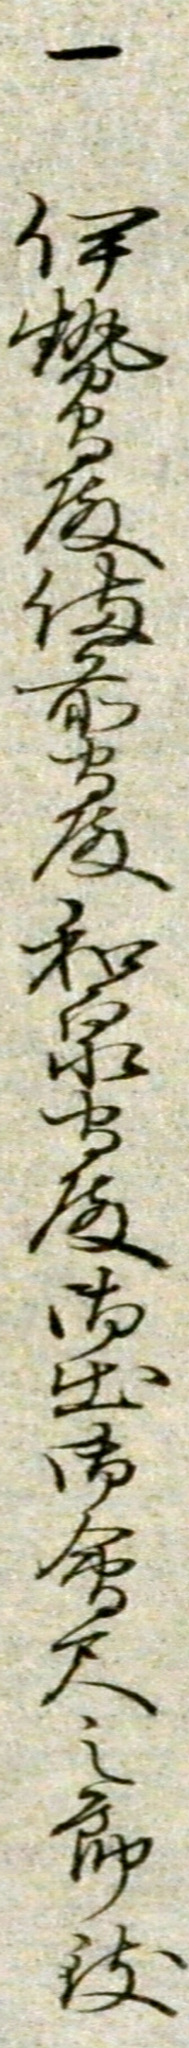一伊勢守殿備前守殿和泉守殿御出御会尺之節致
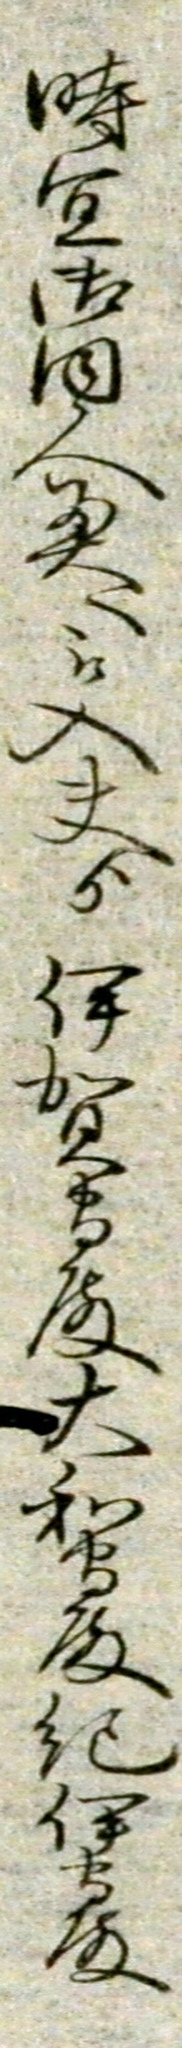時宜御同人奥へ被入夫ゟ伊賀守殿大和守殿紀伊守殿
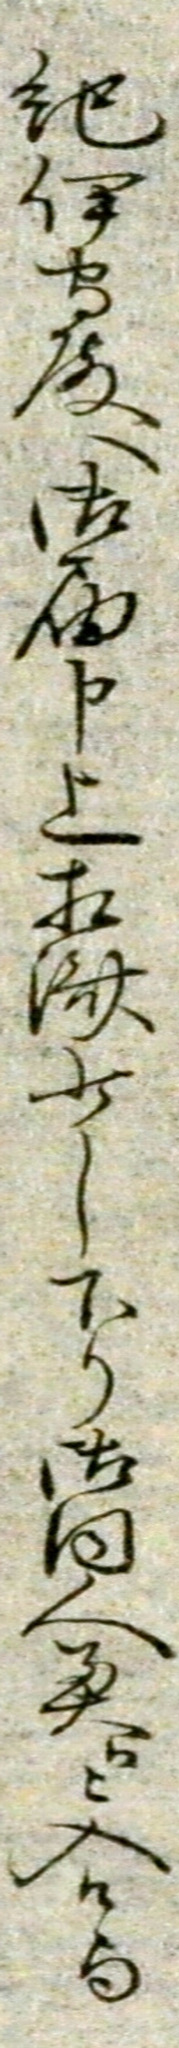紀伊守殿へ御届申上相済少し下り御同人奥江被入候間
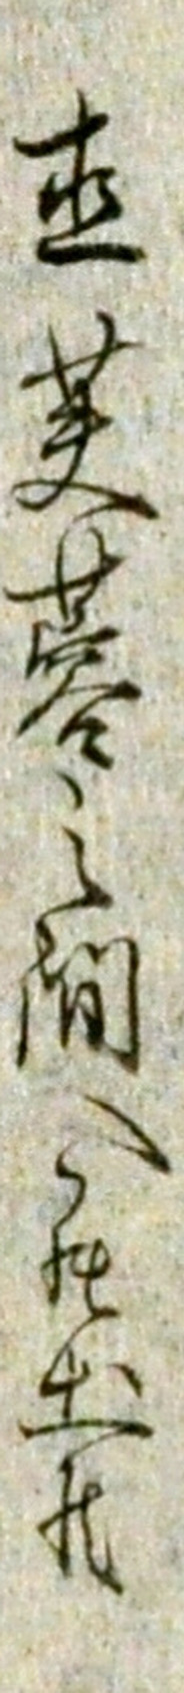直芙蓉之間へ罷出候
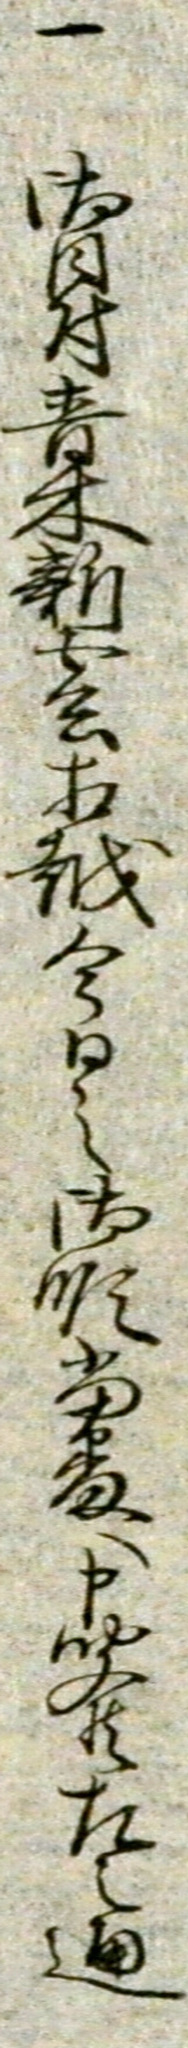一御目付青木新七玄相越今日之御順当番へ申聞共左之通
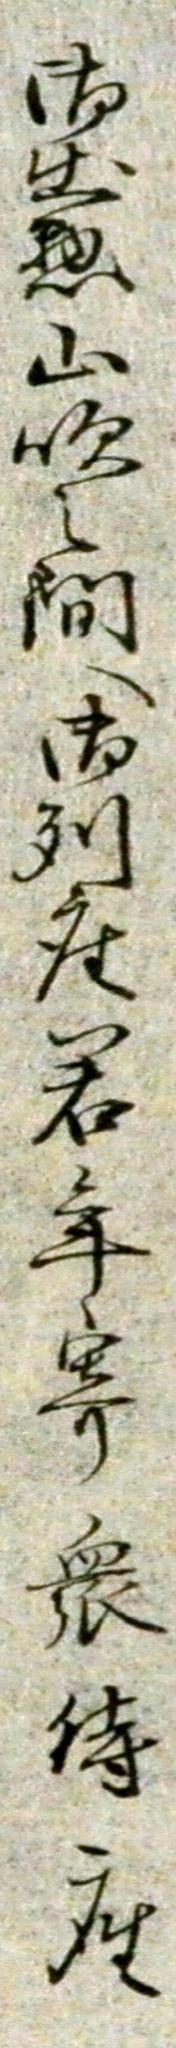御出惣山吹之間へ御列座若年寄衆待座
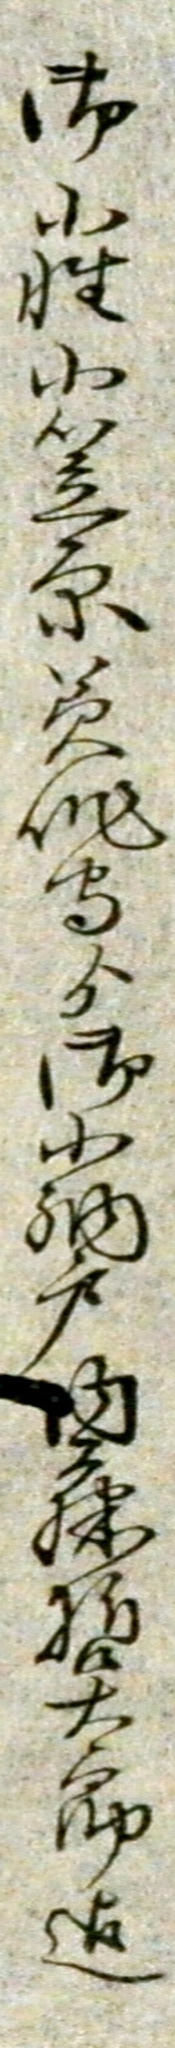御小性小笠原美作守ゟ御小納戸内藤様太筋迄
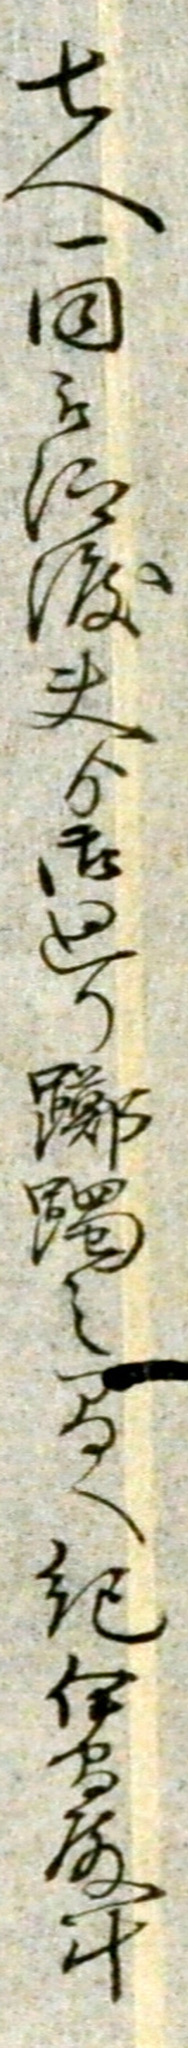七人一同被仰渡夫ゟ御廻り躑躅之間へ紀伊守殿計
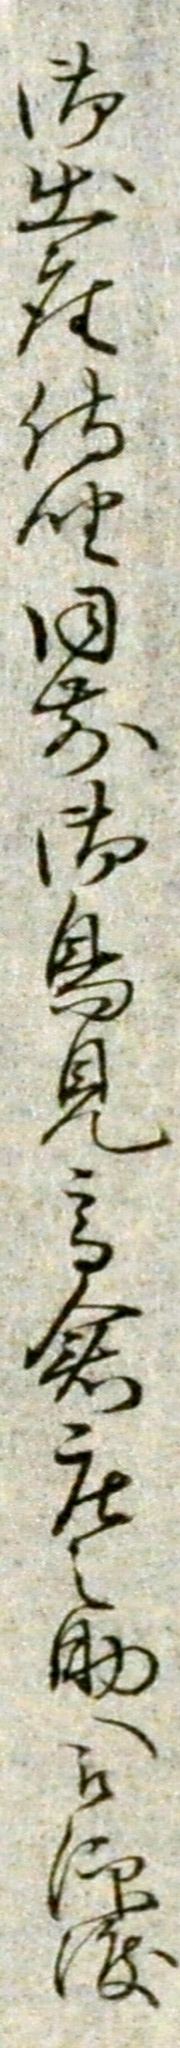御出座侍坐同前御鳥見高倉庄之助へ被仰渡
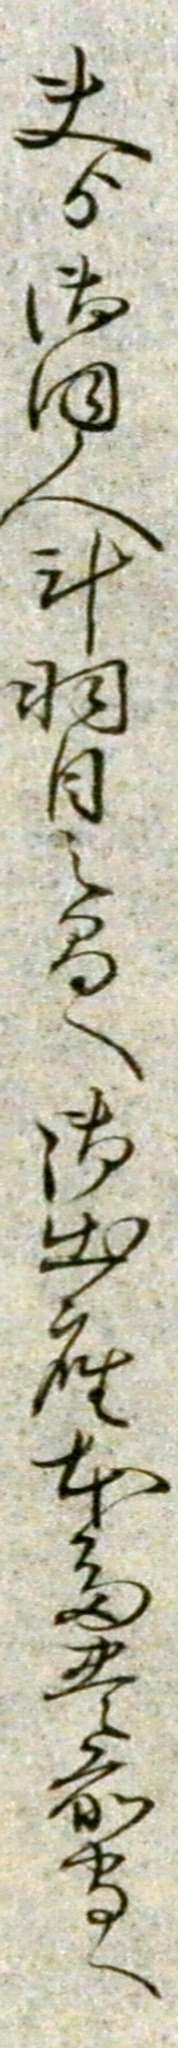夫ゟ御同人計羽目之間へ御出座本多豊前守へ
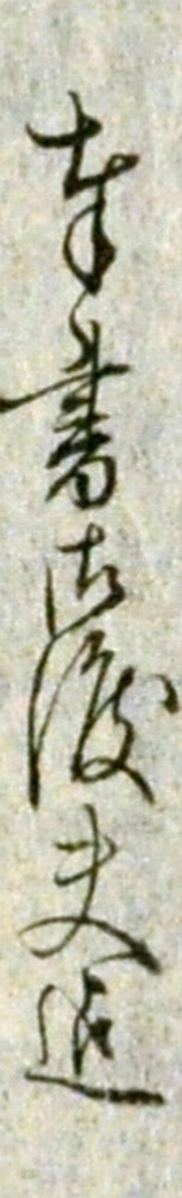奉書御渡夫迄
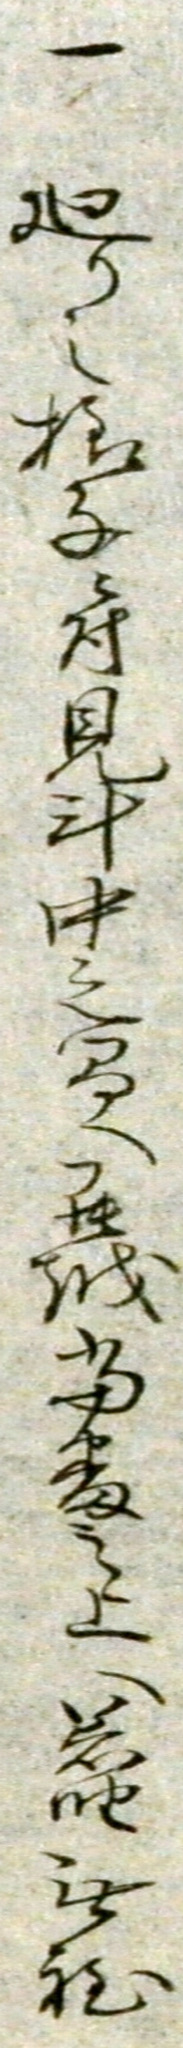一廻り之様子ニ付見計中之間へ罷越当番之上へ着座無程
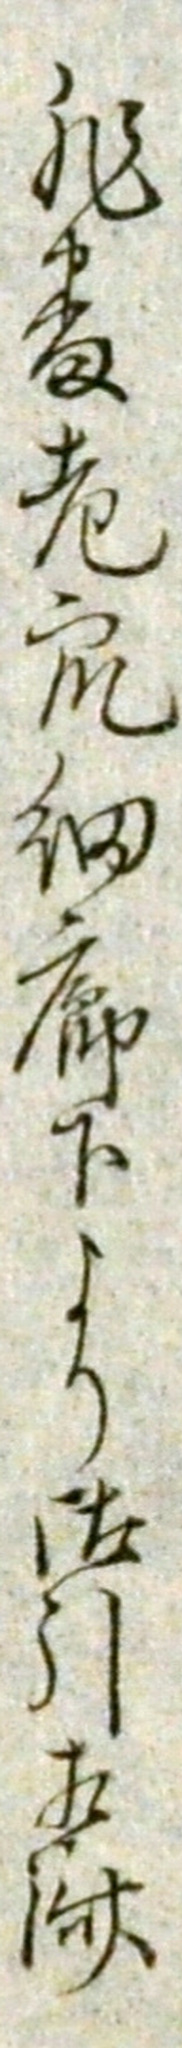非番老衆細廊下より御引相済
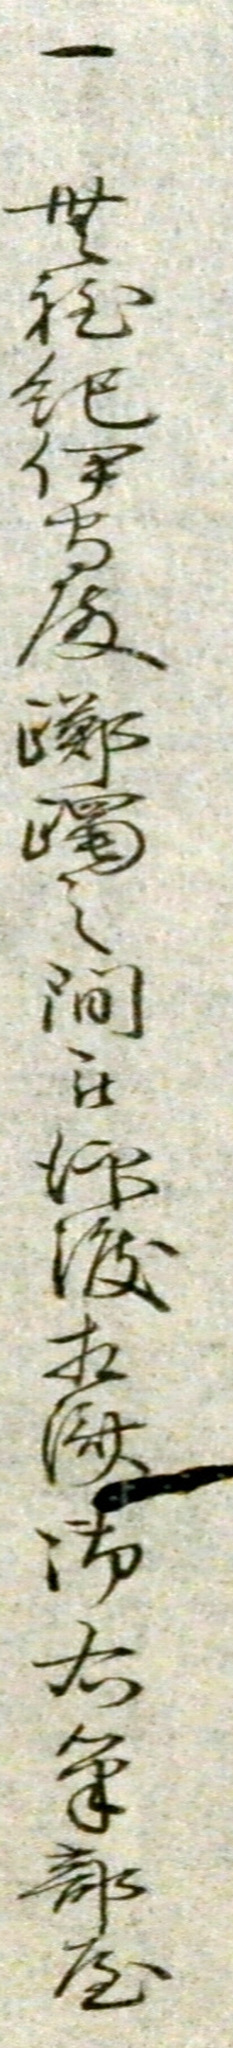一無程紀伊守殿躑躅之間被仰渡相済御右筆部屋
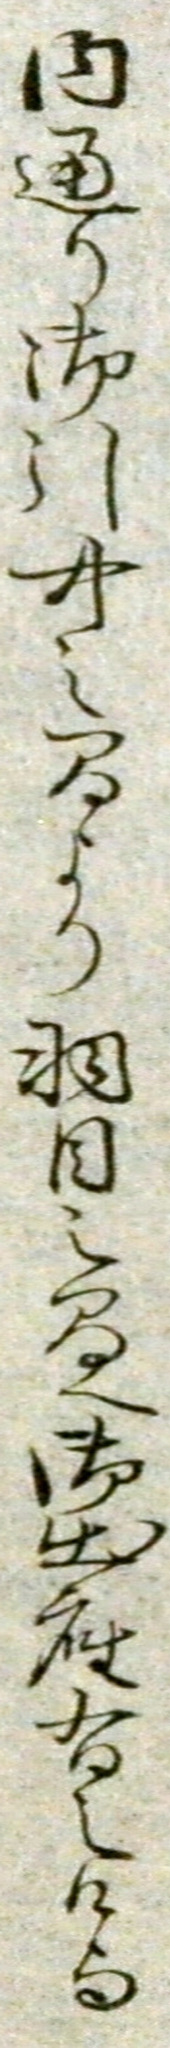内通り御引中之間より羽目之間へ御出座有之候と
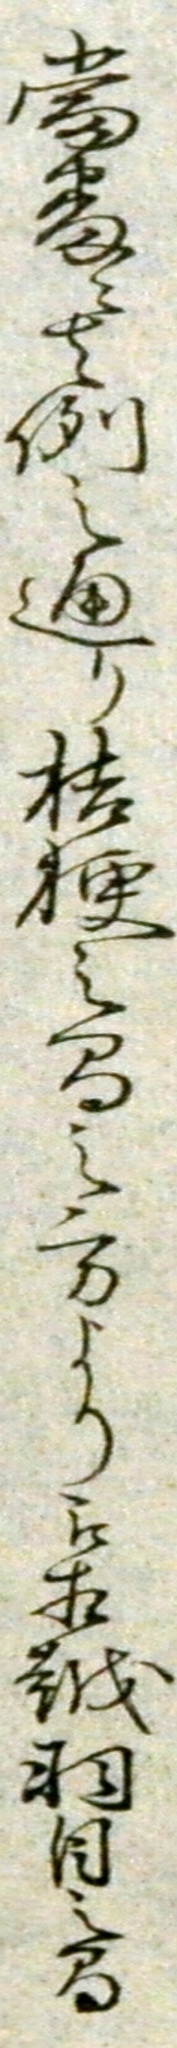当番ニ者例之通り桔梗之間之方より江相越羽目之間
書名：日光御名代相勤候節ノ留
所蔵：伊那市立高遠町図書館・合同会社AMANE
